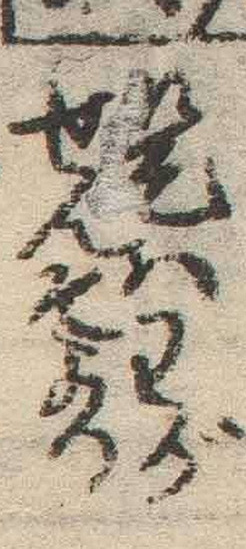せんそより
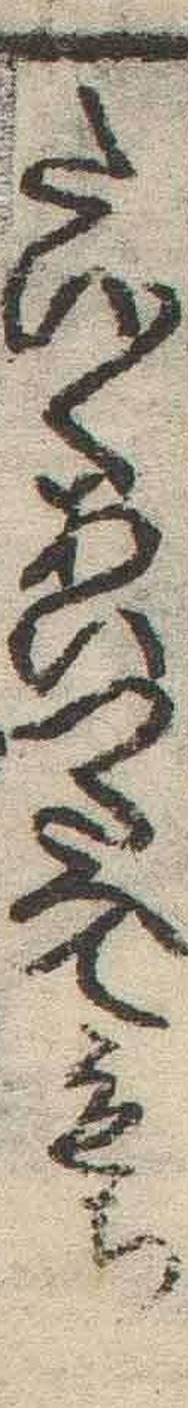たい〳〵あいつたへてもち
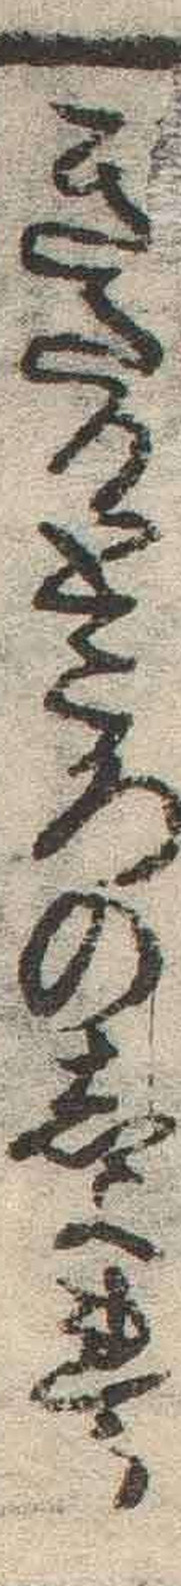きたるところのしよれう
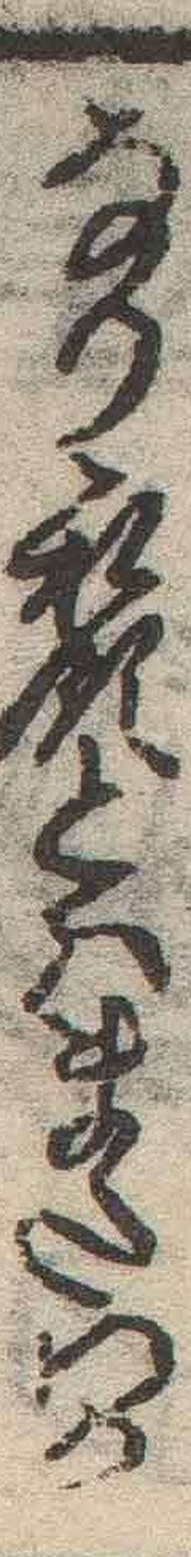なり私領とはまたわか
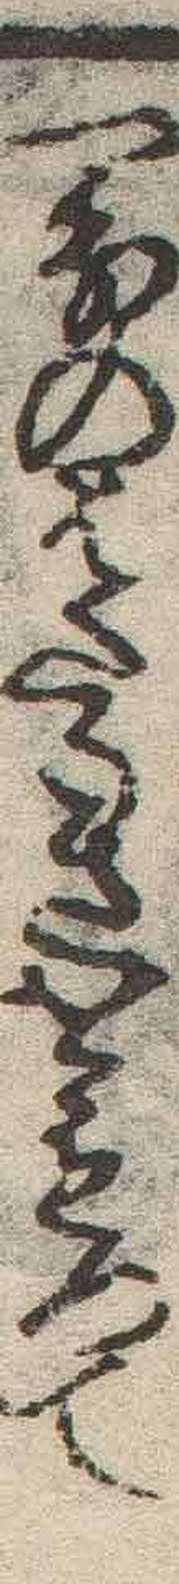一家のはたらきをもつて
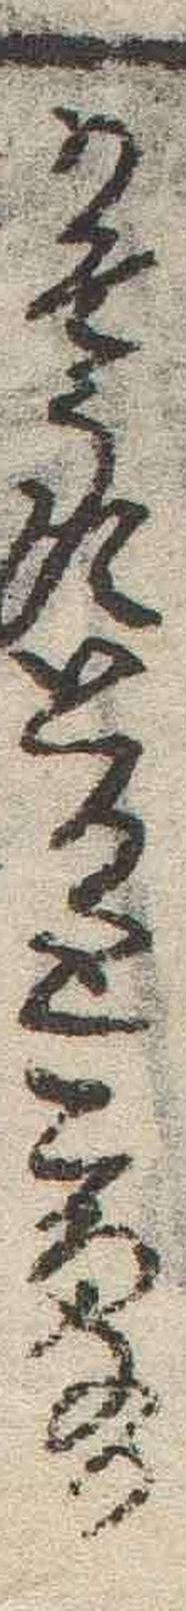かそうにとるところなり
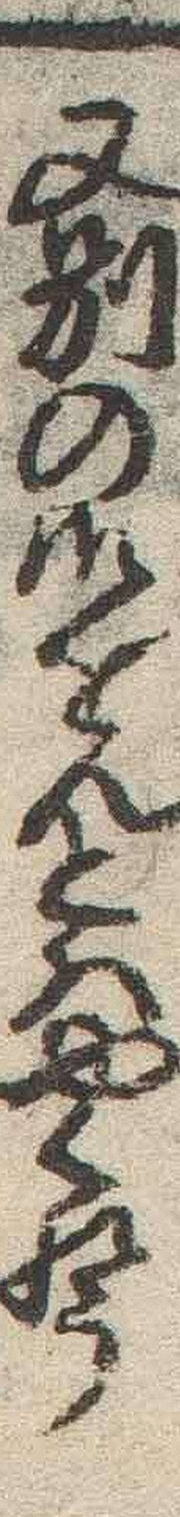又別の御をんとはやくれう
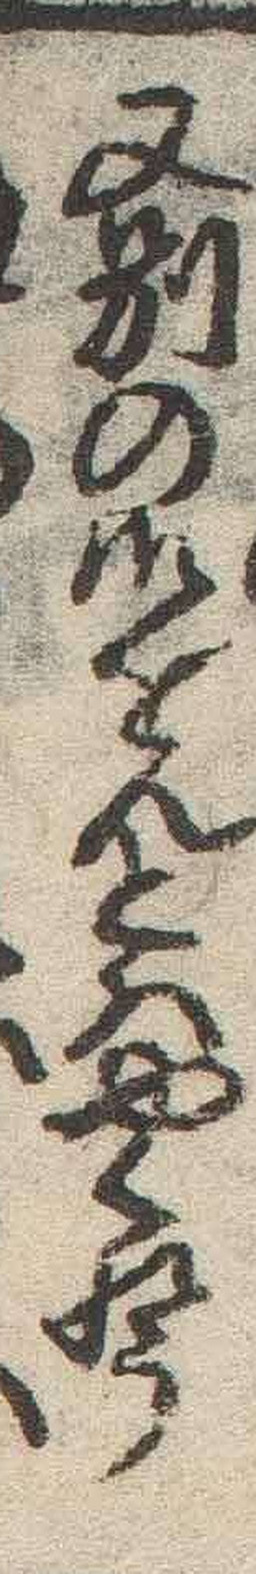又別の御をんとはやくれう
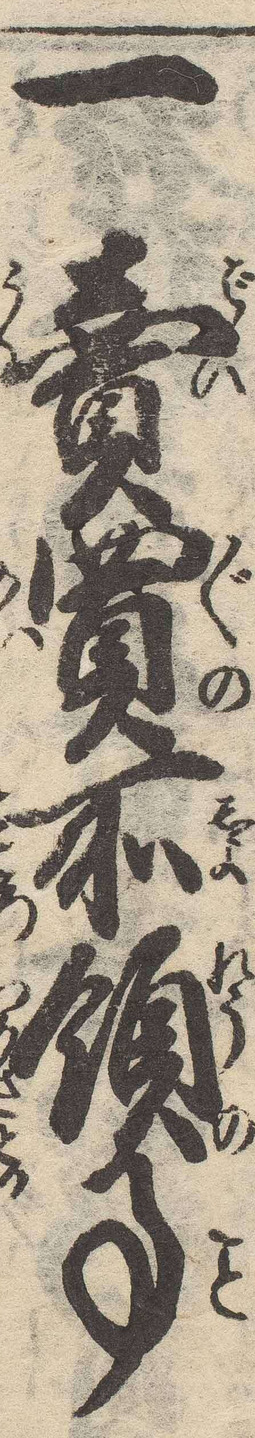一賣買所領事
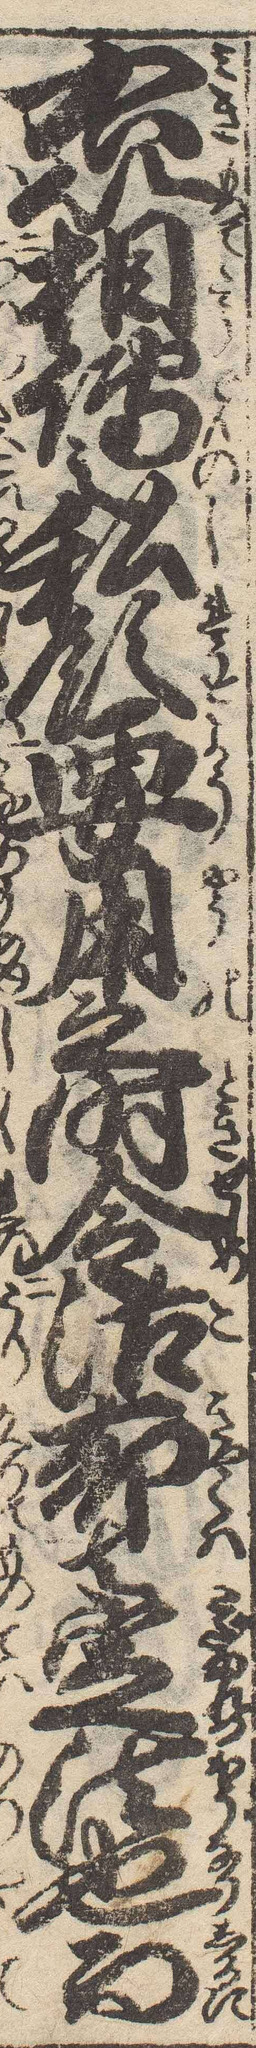右以相傳之私領要用之時令沽却者定法也而
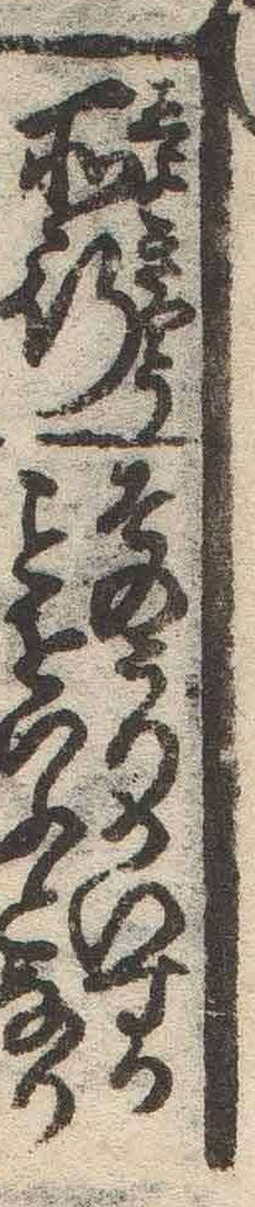所行そのうりかいする
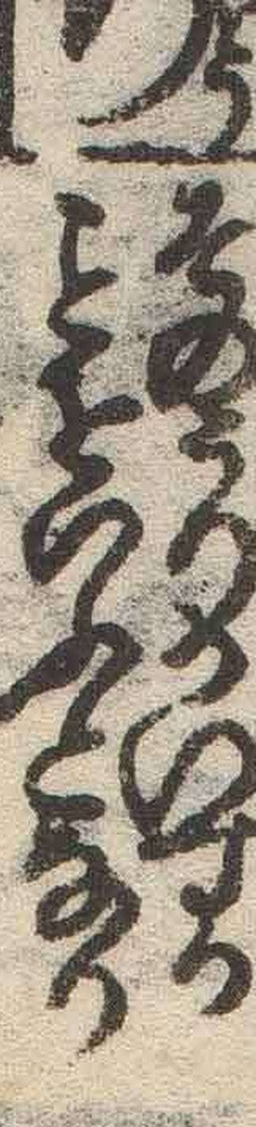ことをいふとなり
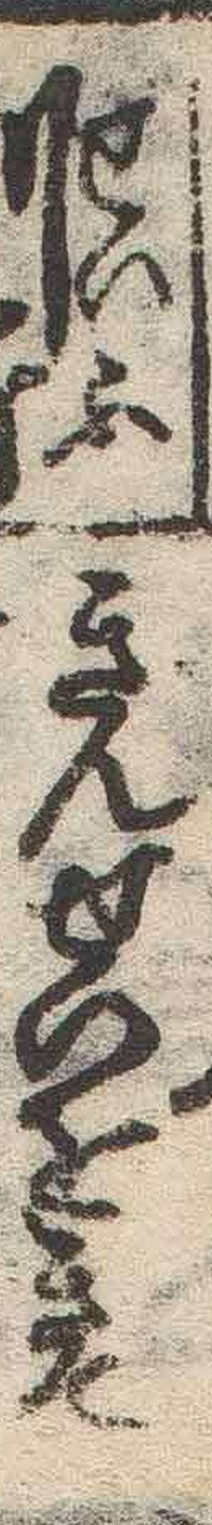制符きんせいをきて
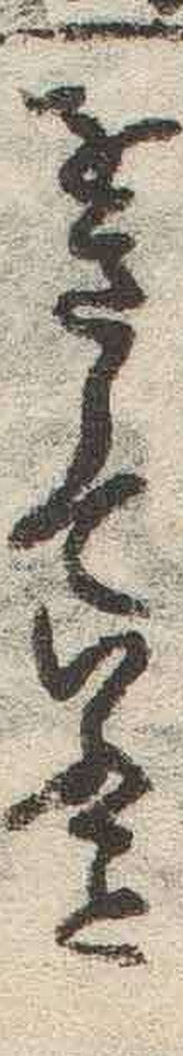をさしていふこと
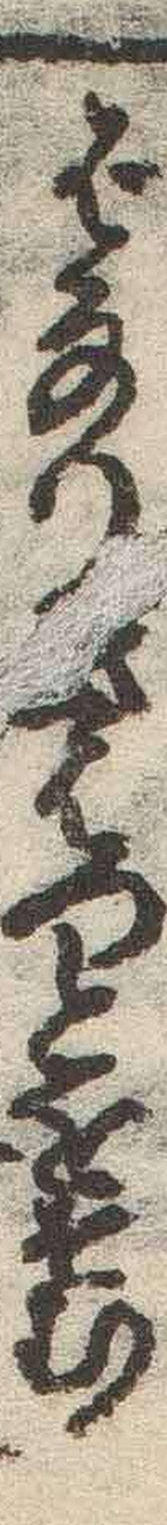ばなり此はつとをそむく
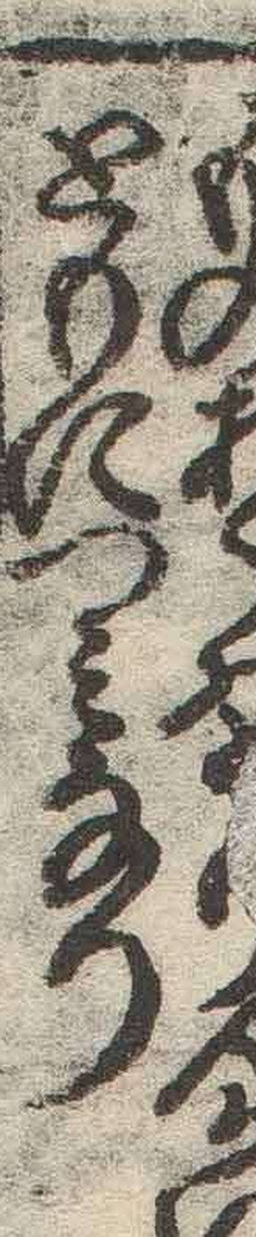ともにつみなり
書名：御成敗式目絵抄
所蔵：東京学芸大学附属図書館 国文学研究資料館
